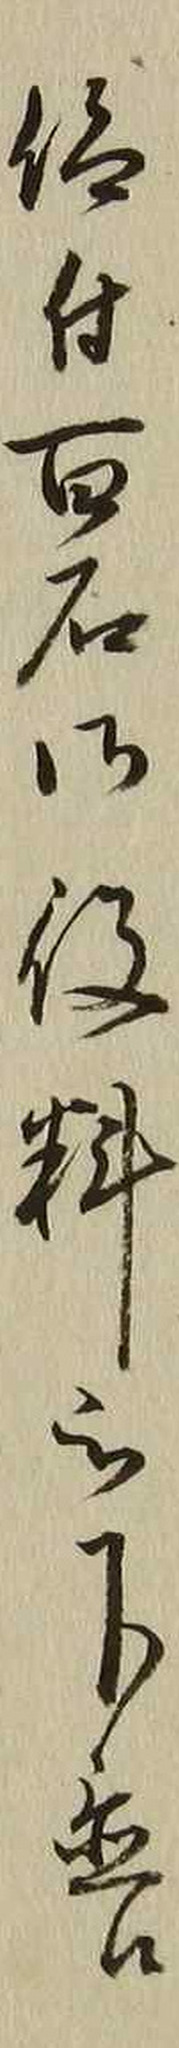仰付百石御役料被下置候
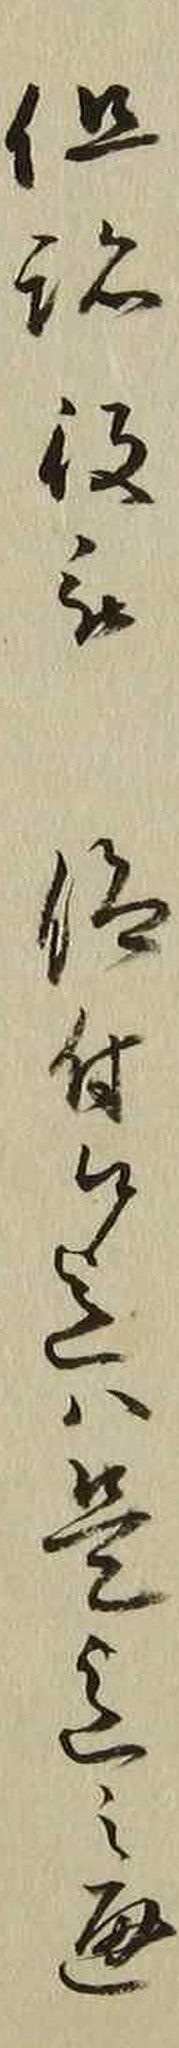但跡役被仰付候迄ハ是迄之通
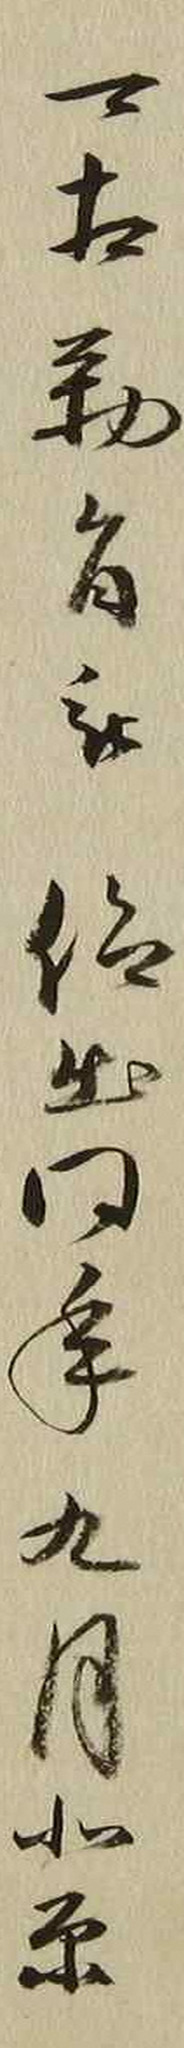可相勤旨被仰出同年九月北原
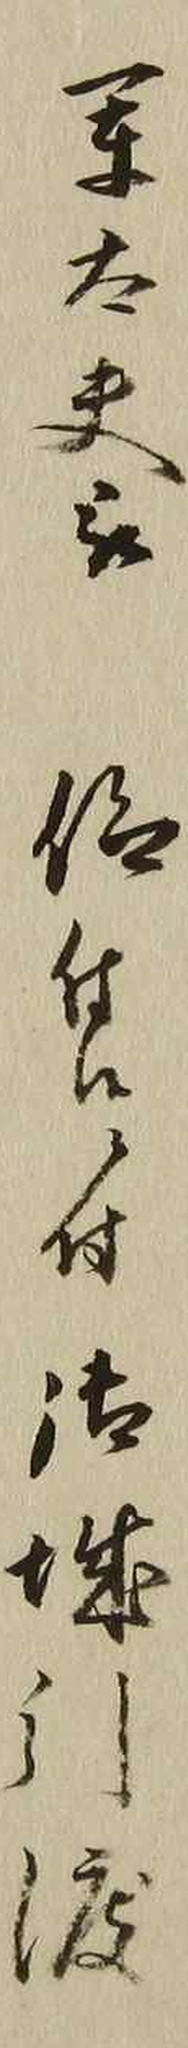軍太夫被仰付候ニ付御城引渡
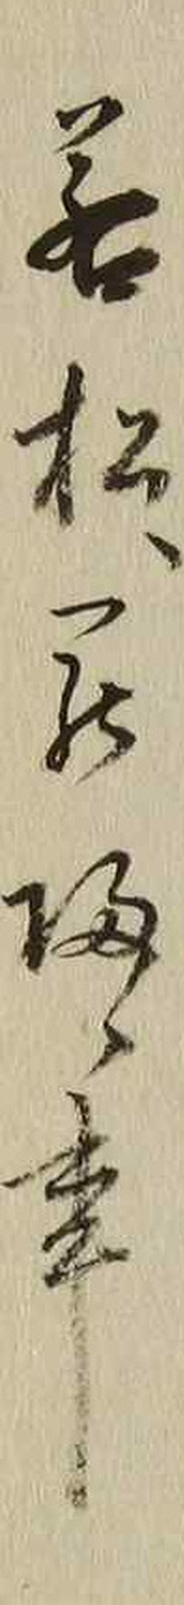若松へ罷帰候事
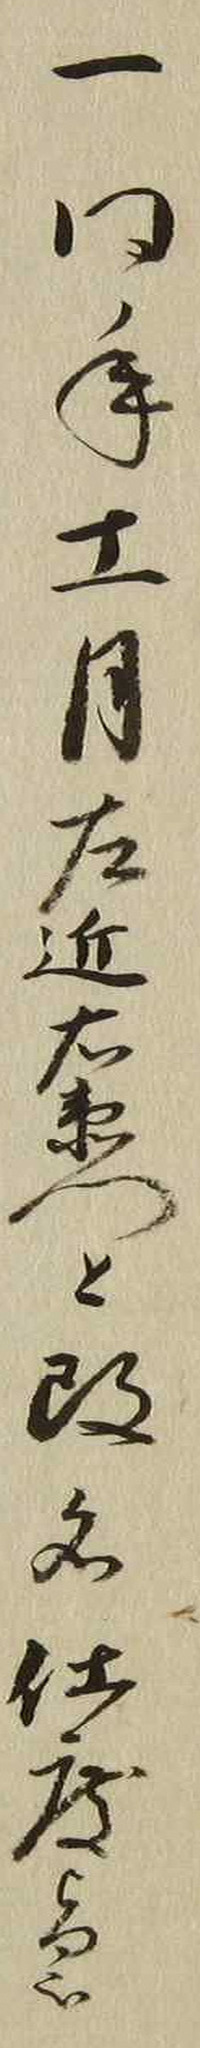一同年十一月左近右衛門と改名仕度旨被
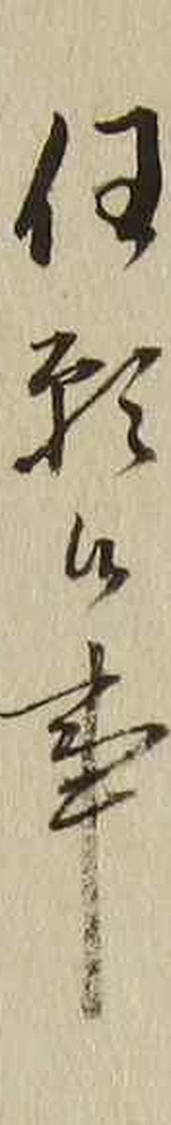任願候事
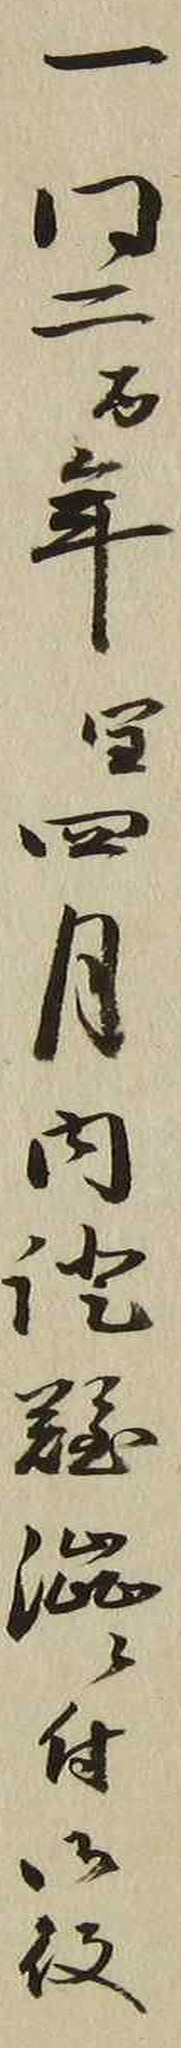一同二酉年閏四月内証難渋ニ付御役
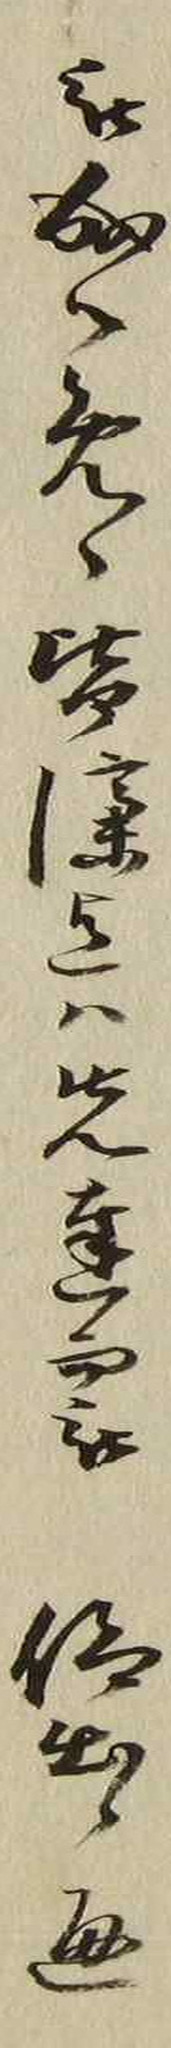被成御免候皆済迄ハ先達而被仰出候通
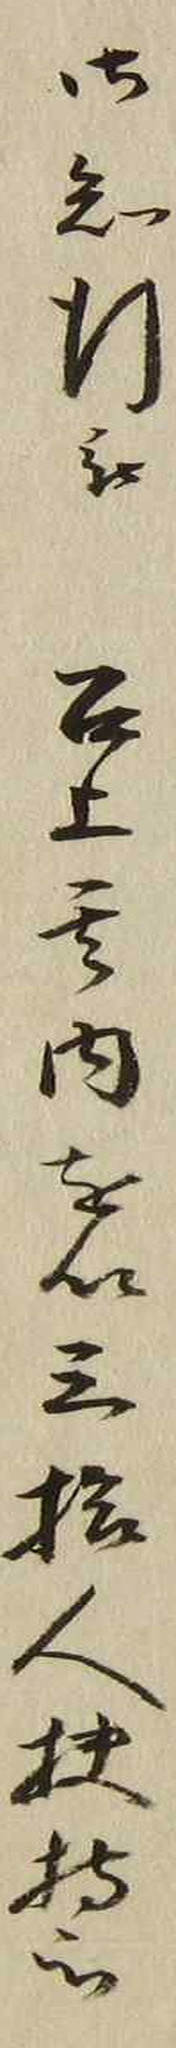御知行被召上其内を以三拾人扶持被
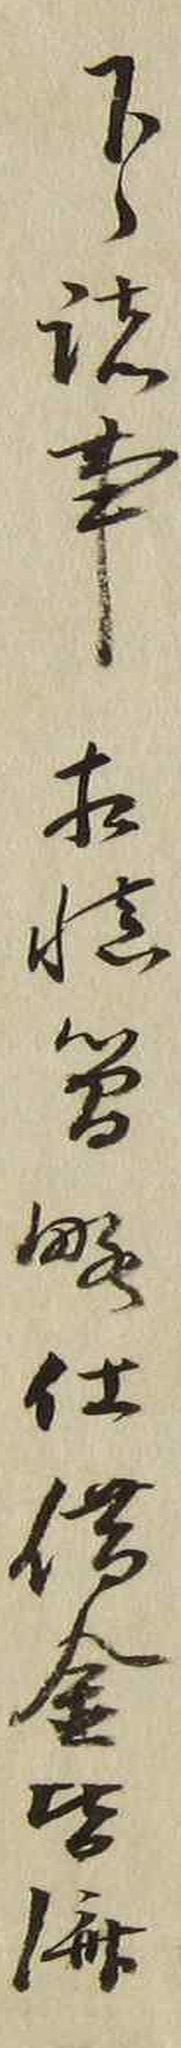下候諸事相慎簡略仕借金皆済
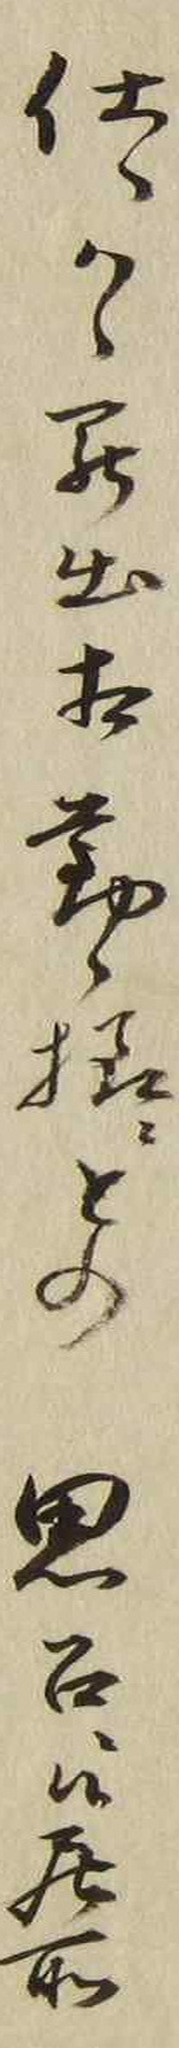仕候ハヽ罷出相勤候様ニとの思召ニ候居所

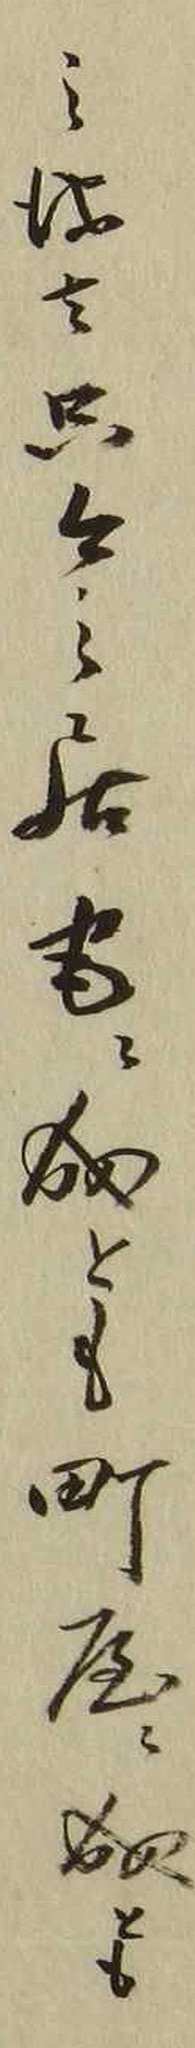之儀者只今之居宅ニ成とも町屋ニ成とも
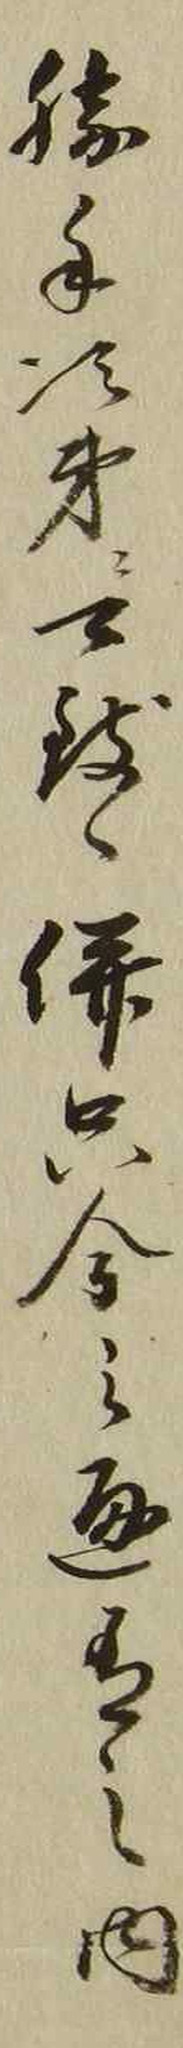勝手次第ニ可致候併只今之通有之内
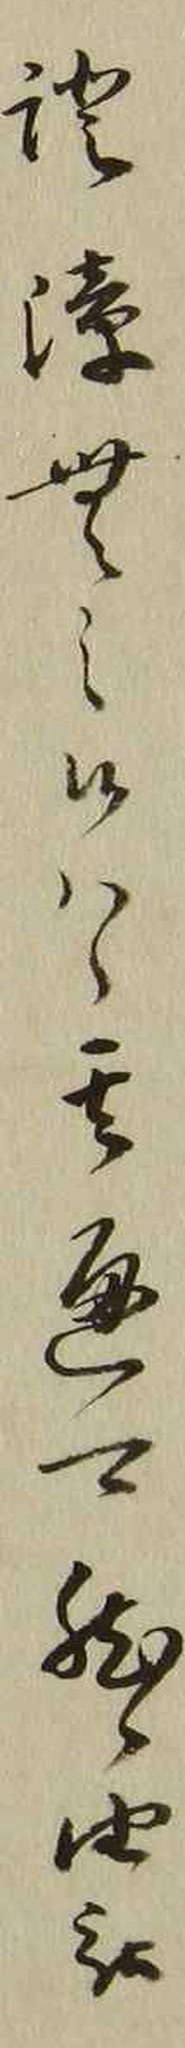証障無之候ハヽ其通可然候由被
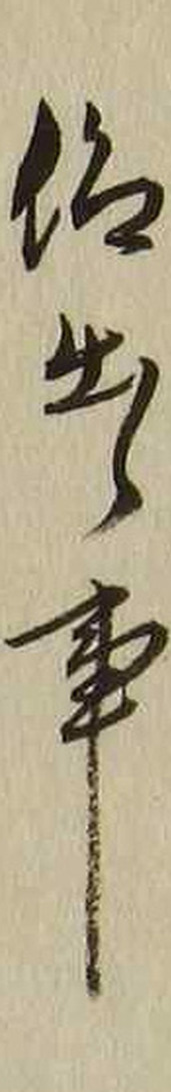仰出候事
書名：諸士系譜　巻之69　を之部3
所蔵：会津若松市立会津図書館
